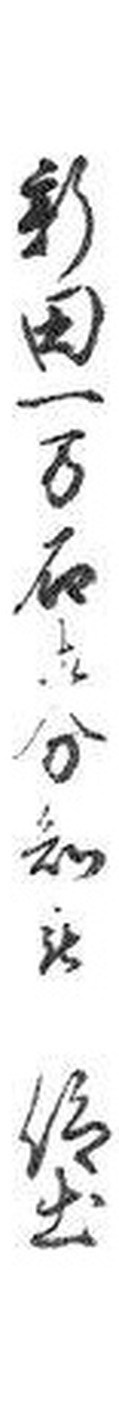新田一万石御分知被仰出
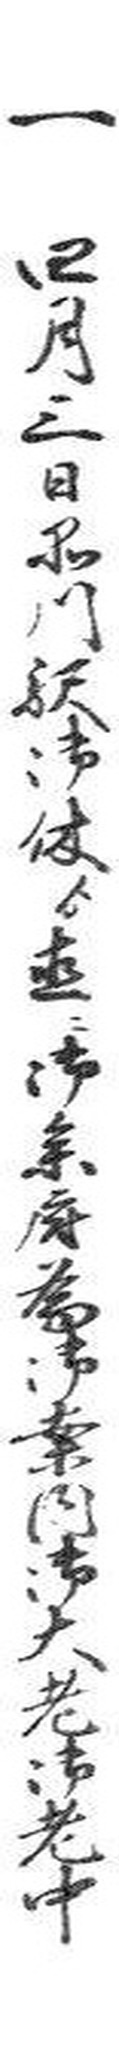一四月三日品川駅御休ゟ直ニ御参府為御案内御大老御老中
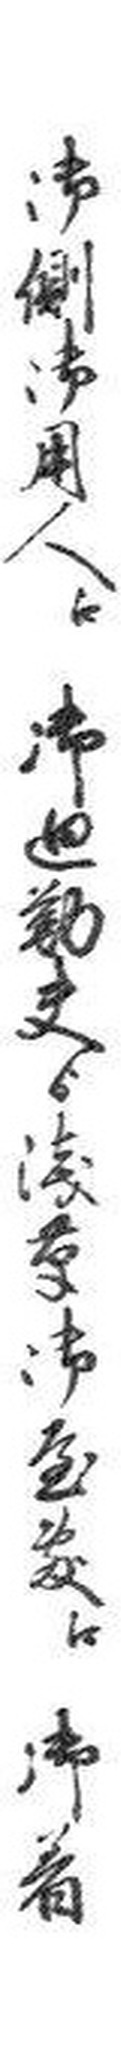御側御用人江御廻勤夫ゟ浅草御屋敷江御着
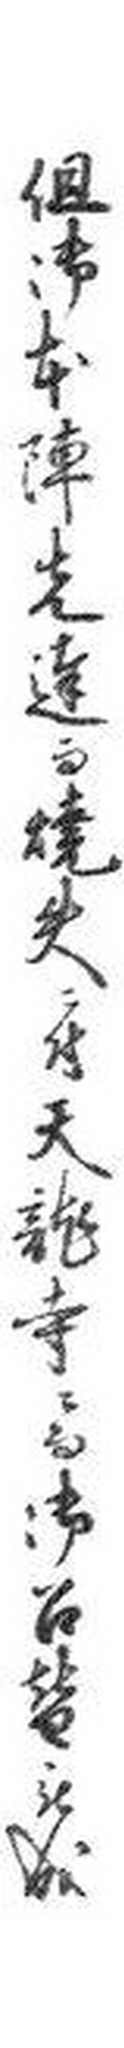但御本陣先達而焼失ニ付天龍寺ニ而御召替被成
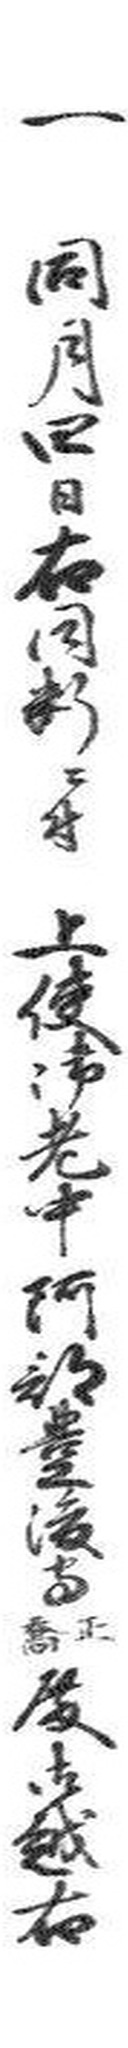一同月四日右同断ニ付上使御老中阿部豊後守正喬殿御越右
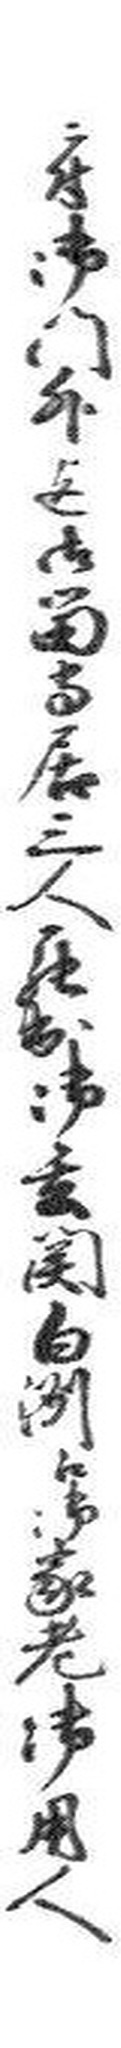ニ付御門外迄御留守居三人罷出御玄関白洲江御家老御用人
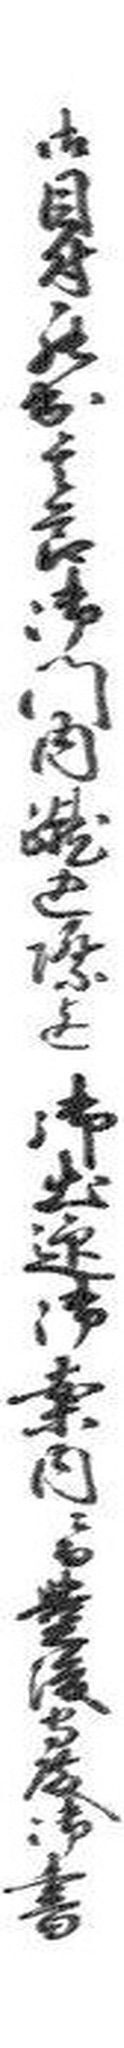御目付罷出其節御門内蹴上込際迄御出迎御案内ニ而豊後守殿御書
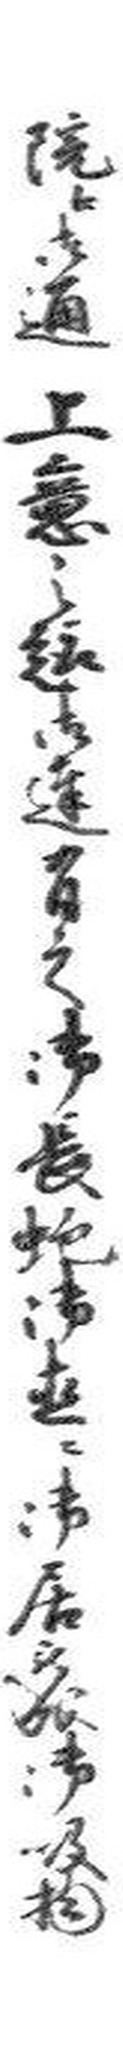院江御通上意之趣御達有之御長蚫御直ニ御居被成御吸物
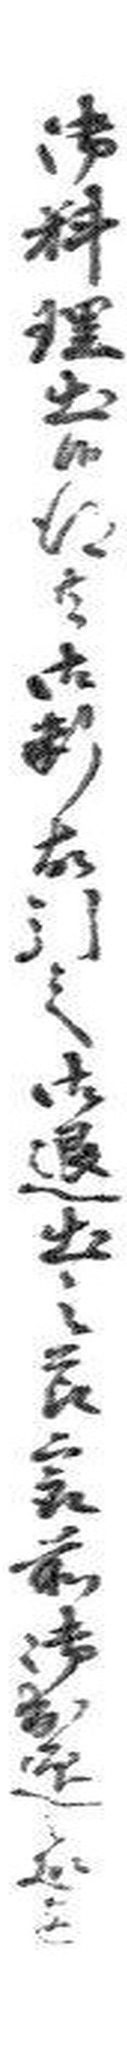御料理出候得共御断故引之御退出之節最前御出迎之処迄
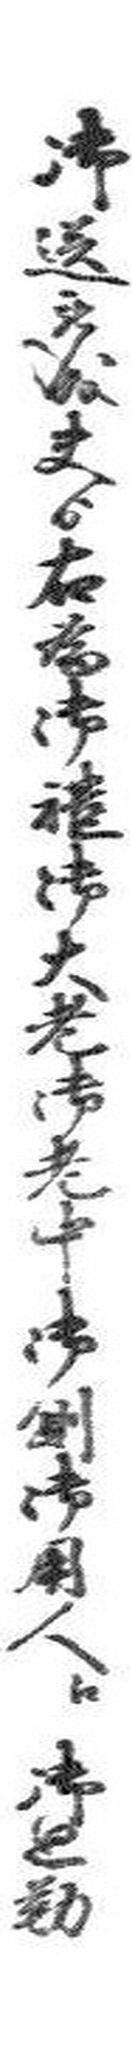御送被成夫ゟ右御礼御大老御老中御側御用人江御廻勤
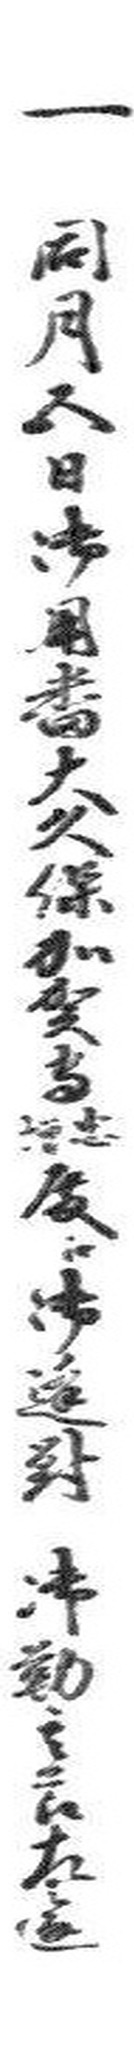一同月五日御用番大久保加賀守忠増殿江御逢對御勤其節左之通
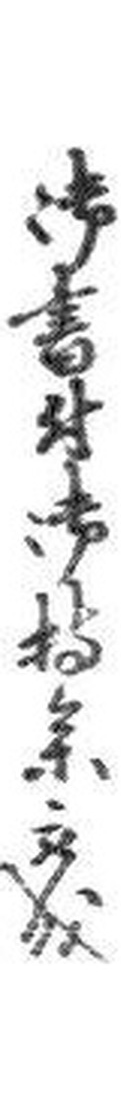御書付御持参被成
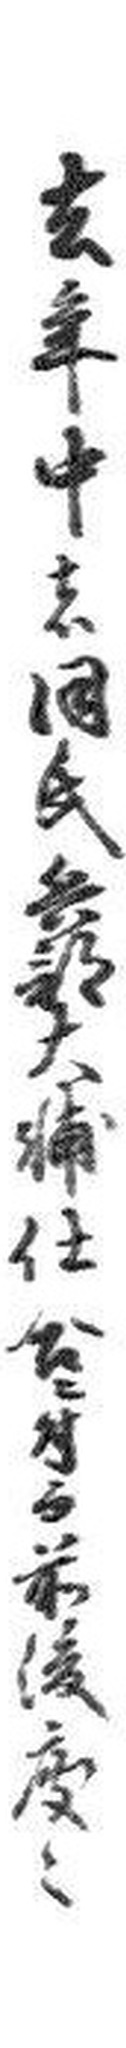去年中者同氏兵部大輔仕合ニ付而前後度々
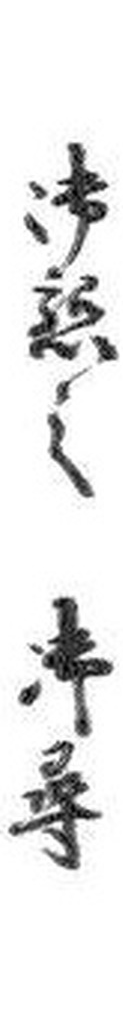御懇之御尋
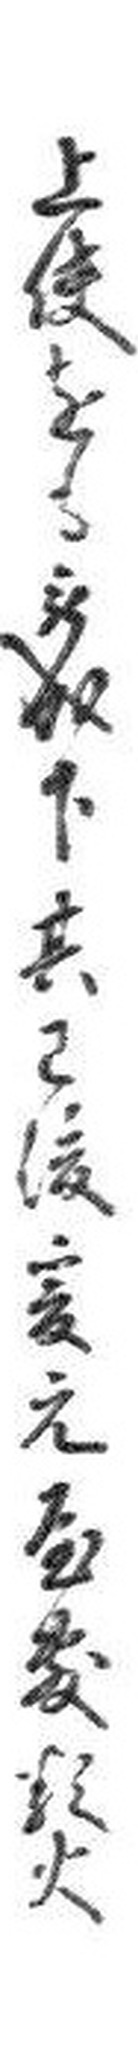上使をも被成下成其已後爰元屋敷類火
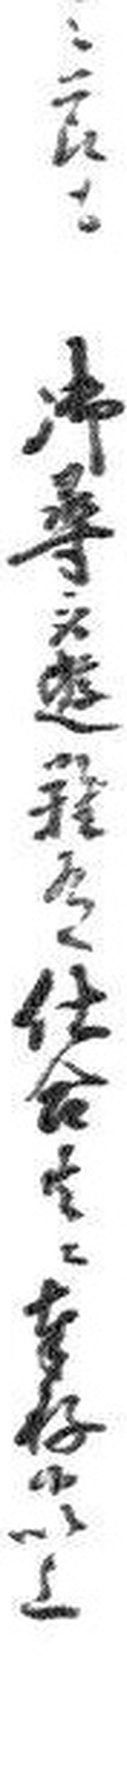之節も御尋被遊難有仕合共ニ奉存候以上
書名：家譜 二十九 吉邦公 従正徳二年到正徳三年
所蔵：福井県文書館 Fukui Prefectural Archives
